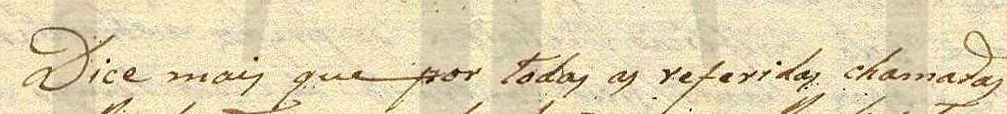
Dice mais que por todas as referidas chamadas
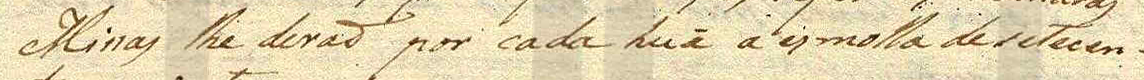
Missas lhe deraõ por cada huā a esmolla de setecen
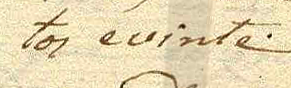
tos e vinte.
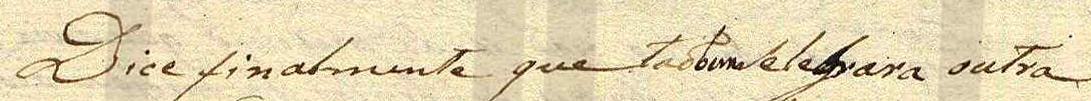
Dice finalmente que taõbem selebrara outra
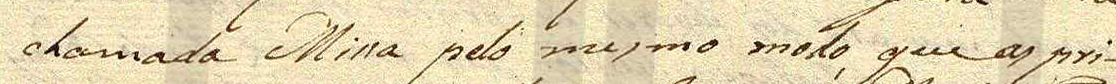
chamada Missa pelo mesmo modo, que as pri
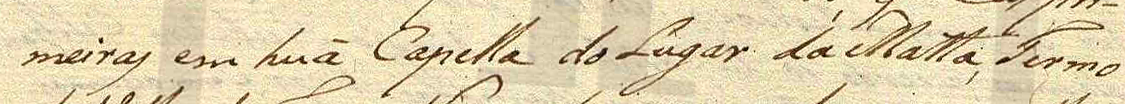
meiras em huā Capella do Lugar da Matta, Termo
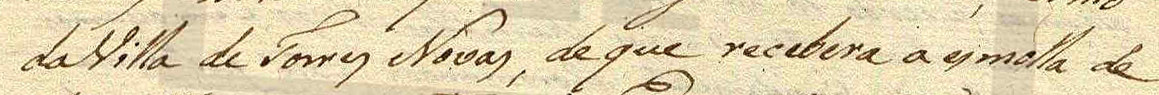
da Villa de Torres Novas, de que recebera a esmolla de
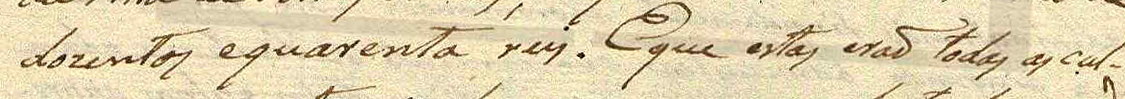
dozentos e quarenta reis. E que estas eraõ todas as cul
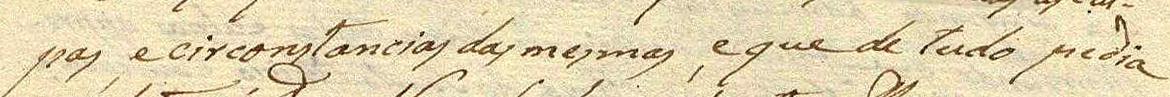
pas e circonstancias das mesmas, e que de tudo pedia
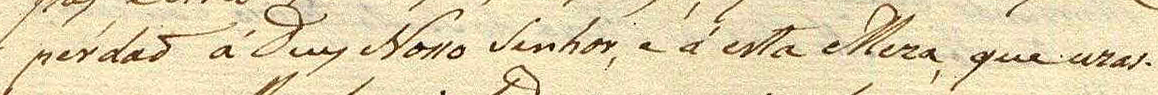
perdaõ á Deus Nosso Senhor, e á esta Meza, que uzas
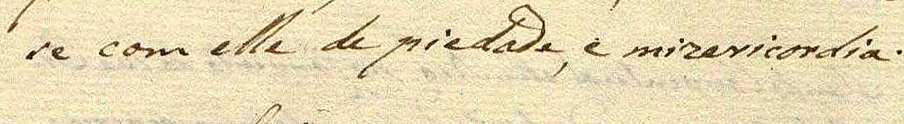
se com elle de piedade, e mizericordia.
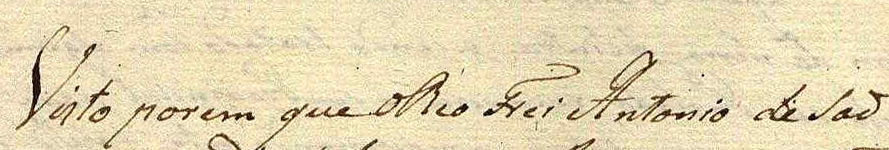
Visto porem que o Reo Frei Antonio de Saõ
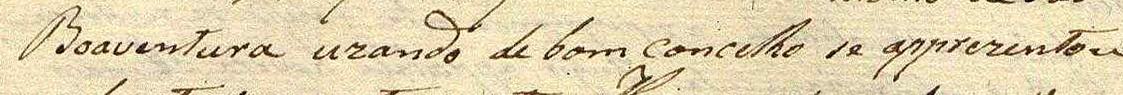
Boaventura uzando de bom concelho se apprezentou
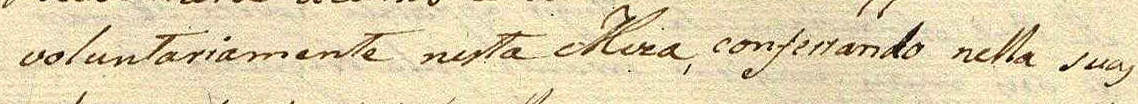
voluntariamente nesta Meza, confessando nella suas
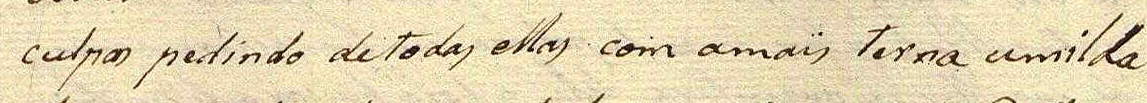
culpas pedindo de todas ellas com a mais terna umilda
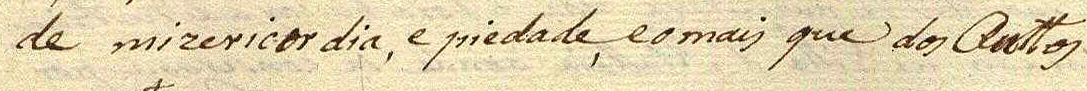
de mizericordia, e piedade, e o mais que dos Auttos
